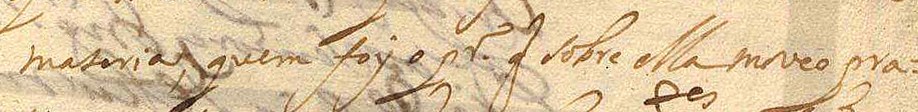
materia, quem foy o pr.o q̄ sobre ella moveo pra
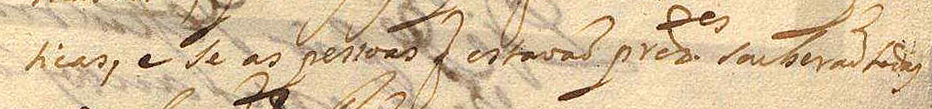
ticas, e se as pessoas q̄ estavaõ prez.tes souberaõ todas
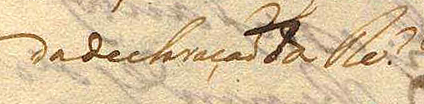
da declaraçaõ da Re?
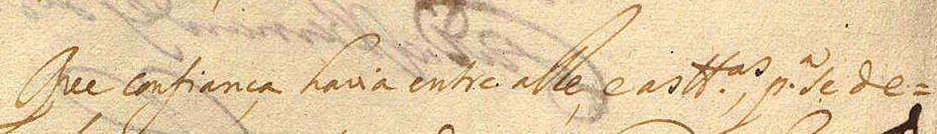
Que confiança hauia entre a Re, e as tt.as, p.a se de
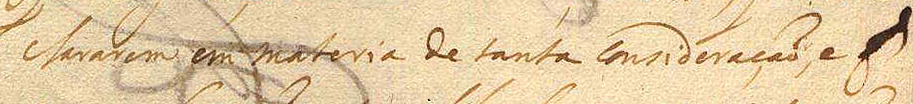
clararem em materia de tanta consideraçaõ, e q̄
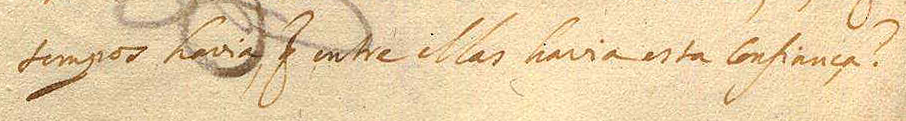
tempos haviaõ, q̄ entre ellas havia esta confiança?
